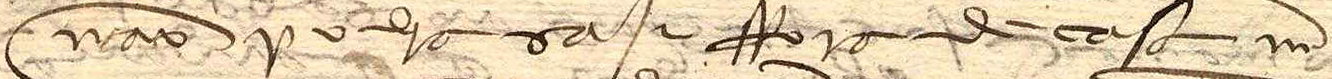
não podja saJr ffora de casa nē
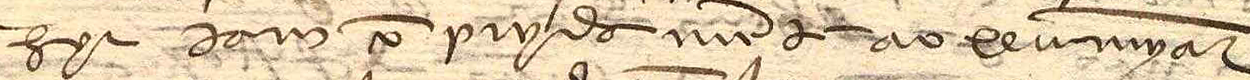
hyr tam cōprydamēte ao llumyar
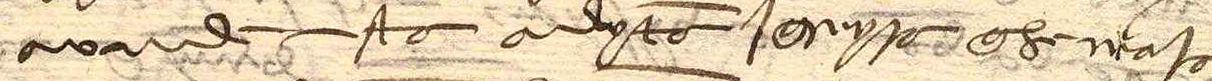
aonde esta a dyta Jgreyja q̄ he maJa
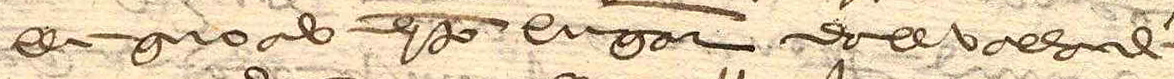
lleguoa do djto lugar dallvallade
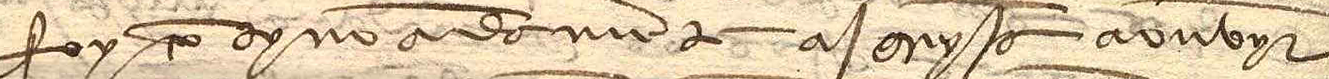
foy c̄otynoadamēte a JgreyJa a ouvyr
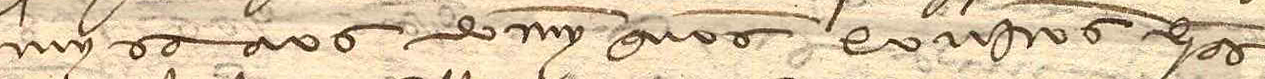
mysa aos dom̄yguos e outros djas
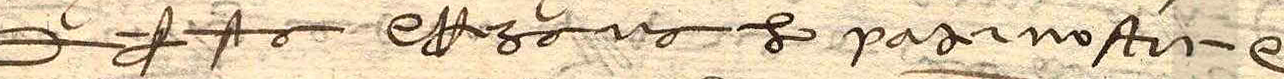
de festa e Rezaua ho pater nostre e
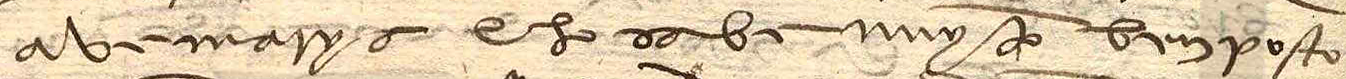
ave marya e ho sabe muyto bem posto
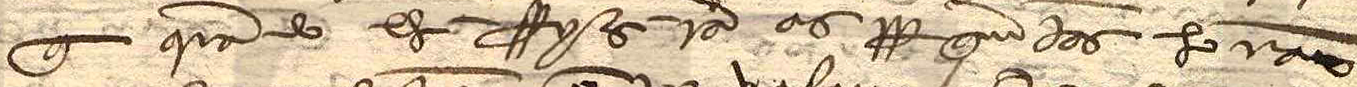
q̄ quādo lhe ffyzerā as ꝑꝑgūtas ho não
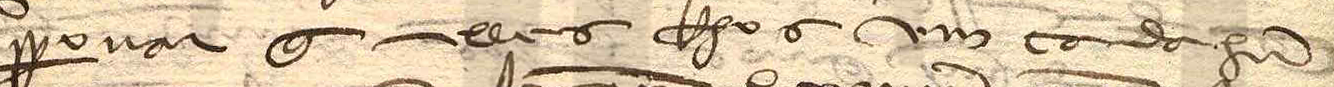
ꝓꝓouar q̄ elles Rꝭos em cada hū
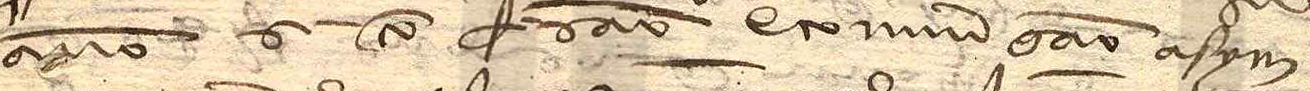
āno se c̄ofesão e comūgão asym
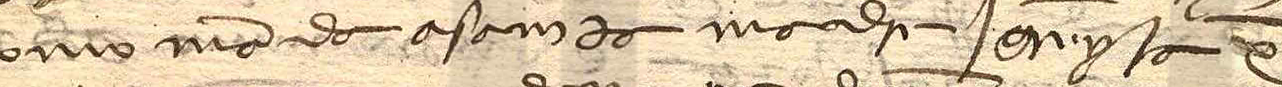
como māda a samta madre JgreyJa e
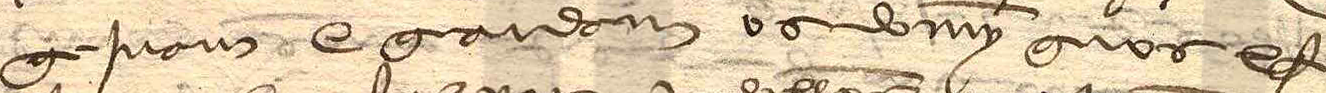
geJuam e guardam os dom̄yguos e fe
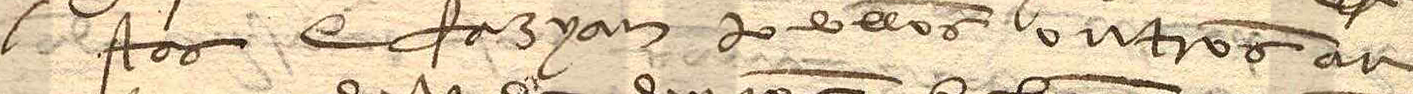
stas e fazyam todollos outros au
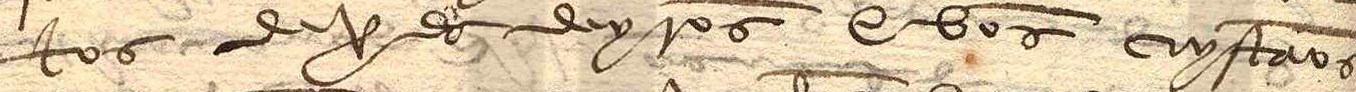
tos de ꝟdadeyros e bōs crystãos
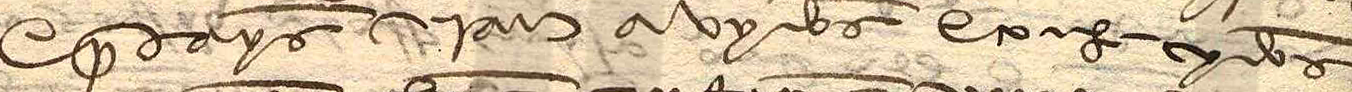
e p̄ tays eram avydos e conhecydos
